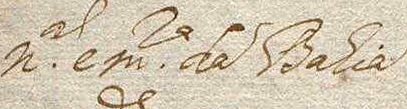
n.al e m.Ra da Bahia
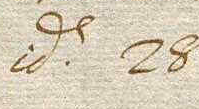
id.e 28
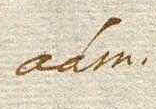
adm.
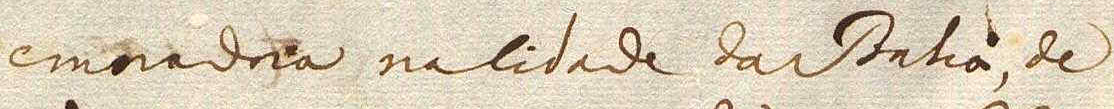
e moradora na cidade da Bahia, de
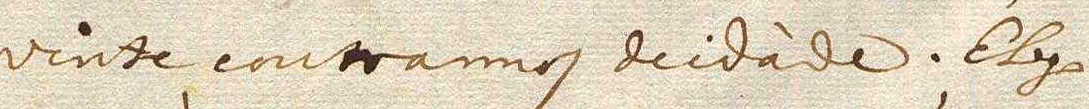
vinte, e outo annos de idàde; E logo
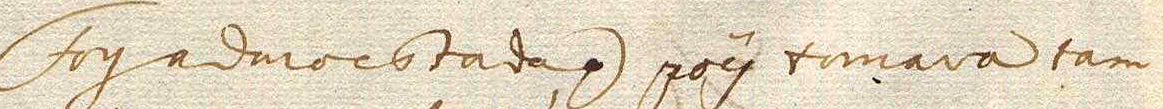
Foy admoestada, q̄ poes tomava tam
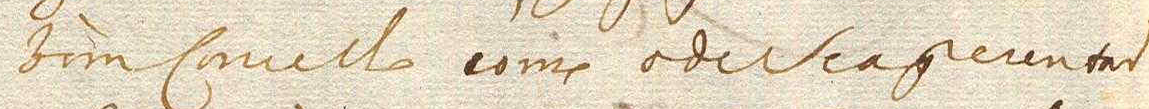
bom Concelho como a de se aprezentar
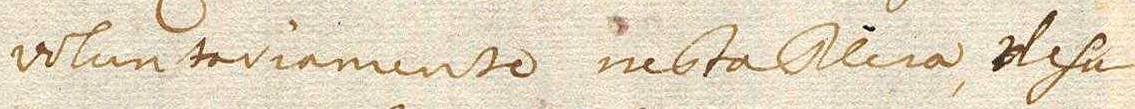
voluntariamente nesta Mesa, de su
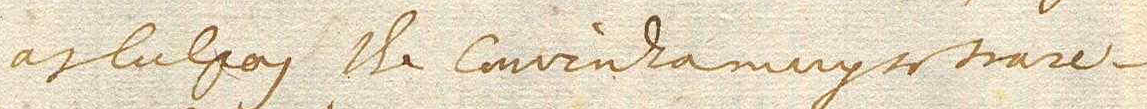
as culpas lhe convinha muyto traze
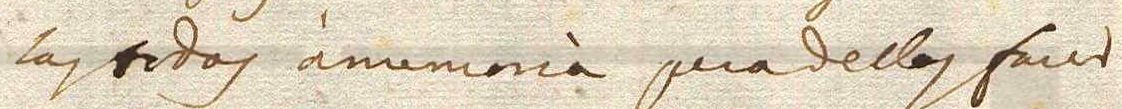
las todas á memorià pera dellas fazer
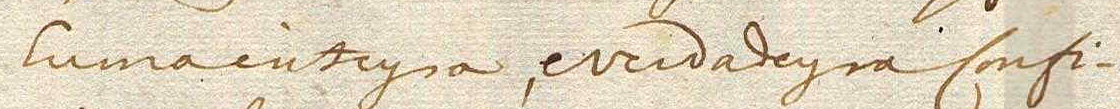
huma inteyra, e verdadeyra Confi
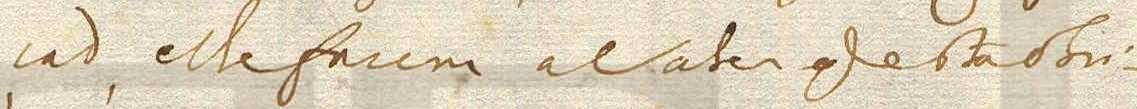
çaõ, e lhe fazem a saber q̄ esta obri
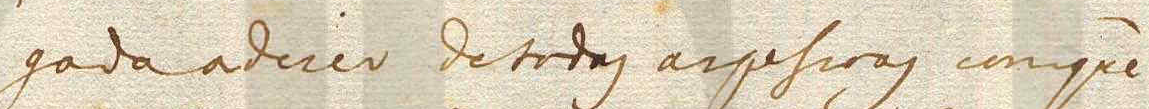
gada a dizer de todas as pessoas com que
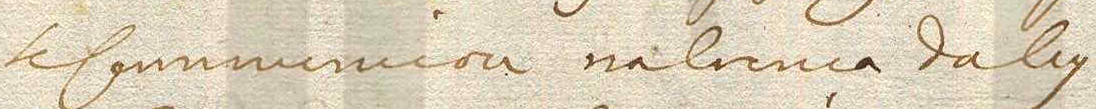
se Communicou na crença da ley
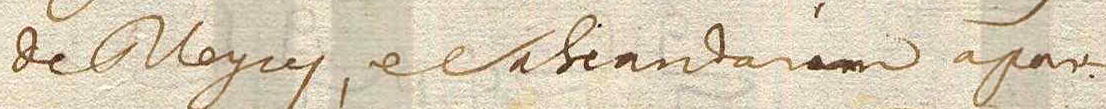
de Moyzes, e sabe andaram apar
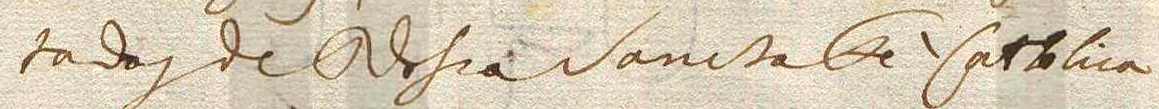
tadas de Nossa Sancta Fé Catholica
